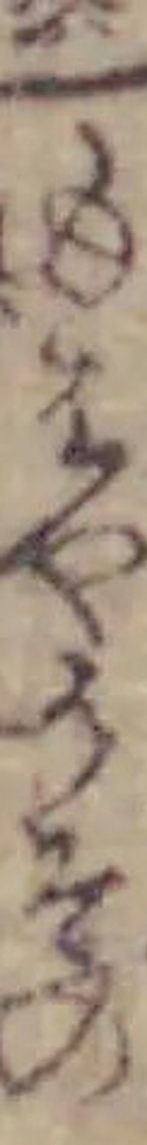もはやうその
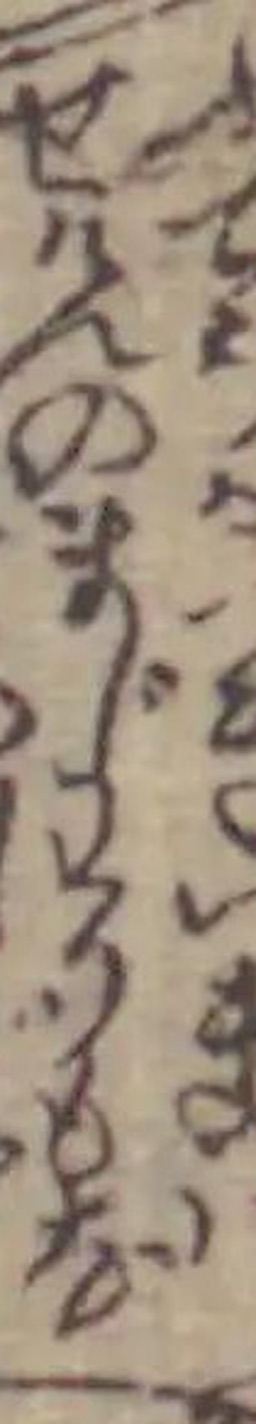せけんのまじわりもな
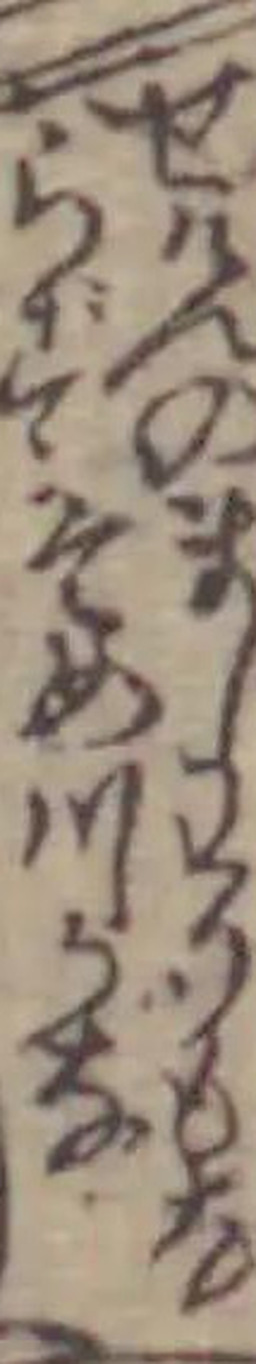らずそめ川がな
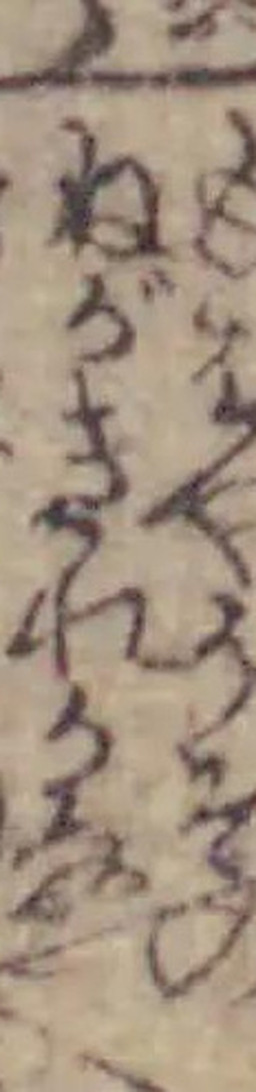ねがきれかなし
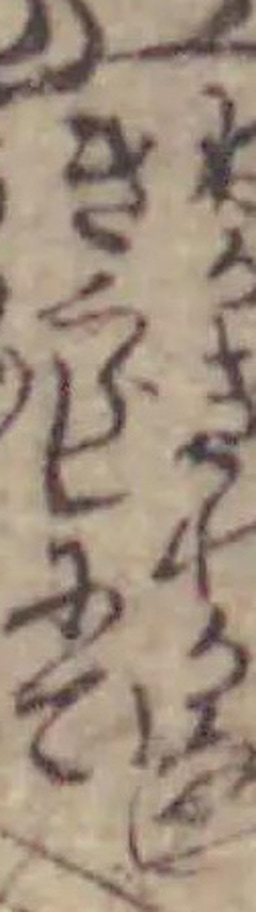きくらしにて
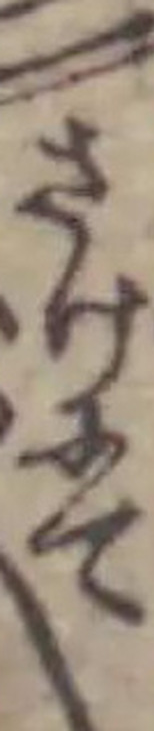さけにて
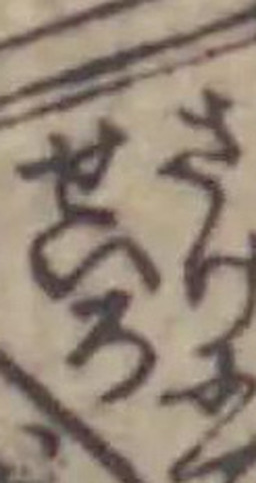せいろ
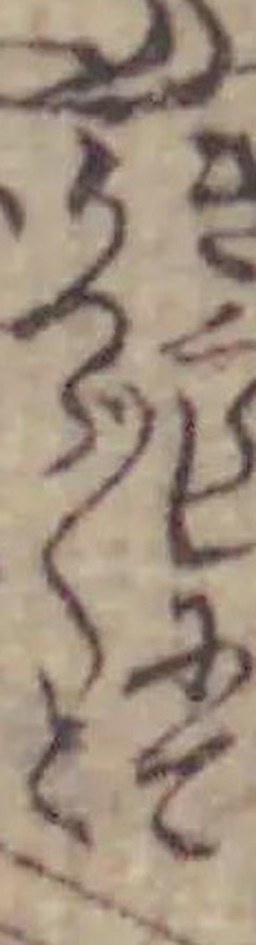うつら〳〵と
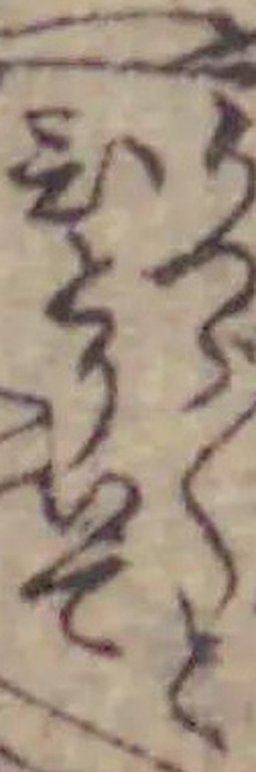ひとりいて
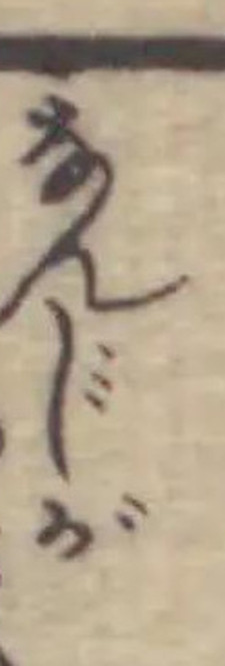なんじが
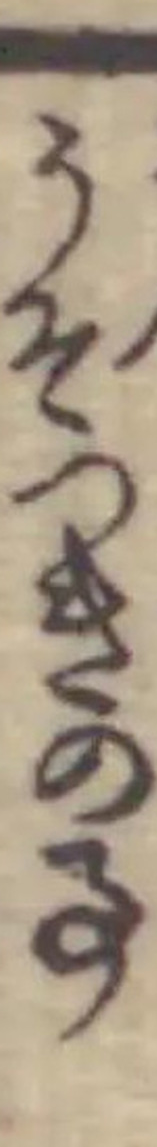うそつきの事
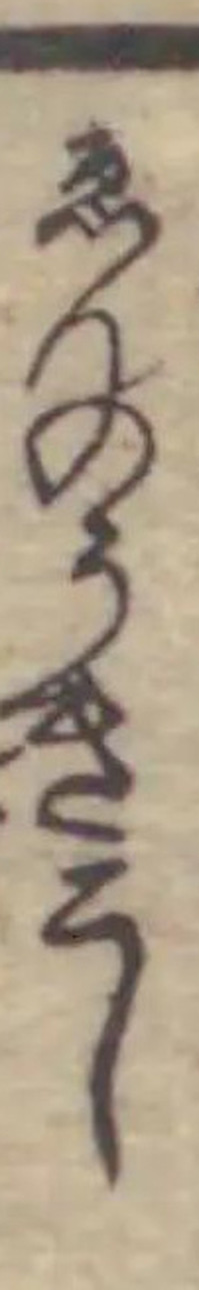ゑんのうきこし
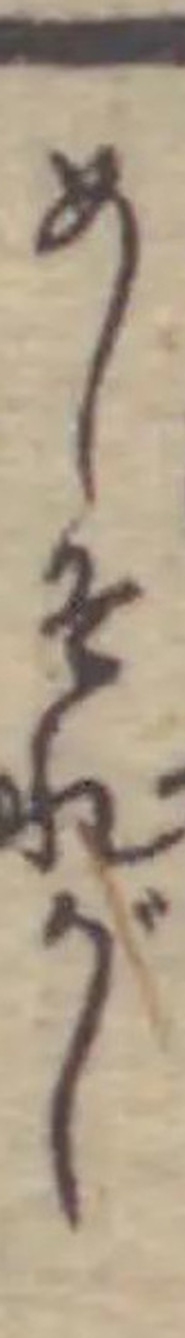めしそれがし
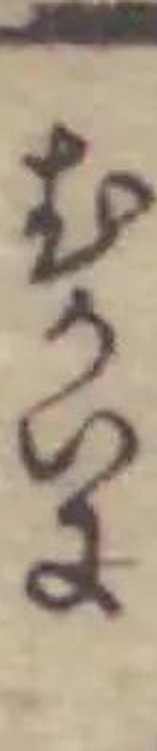むかいに
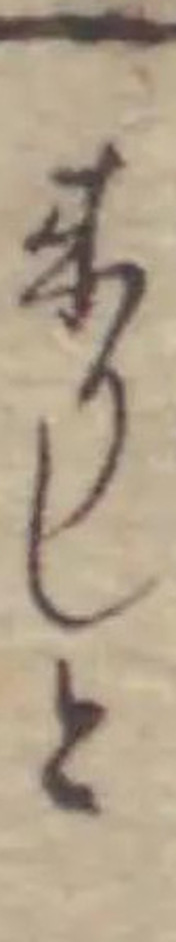来りしと
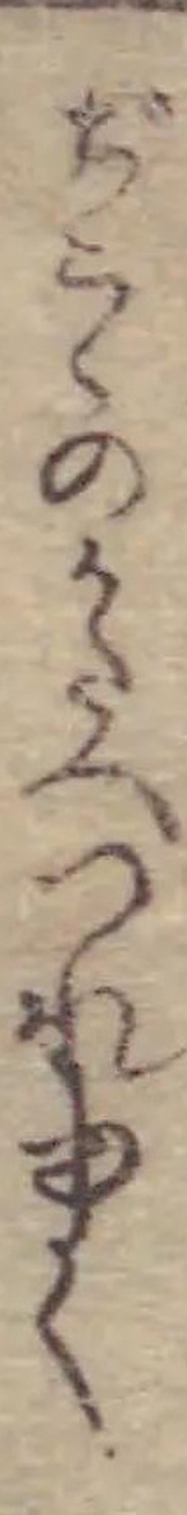ぢごくのかたへつれゆく
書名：虚言弥二郎傾城誠 3巻
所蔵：国立国会図書館 National Diet Library, JAPAN
